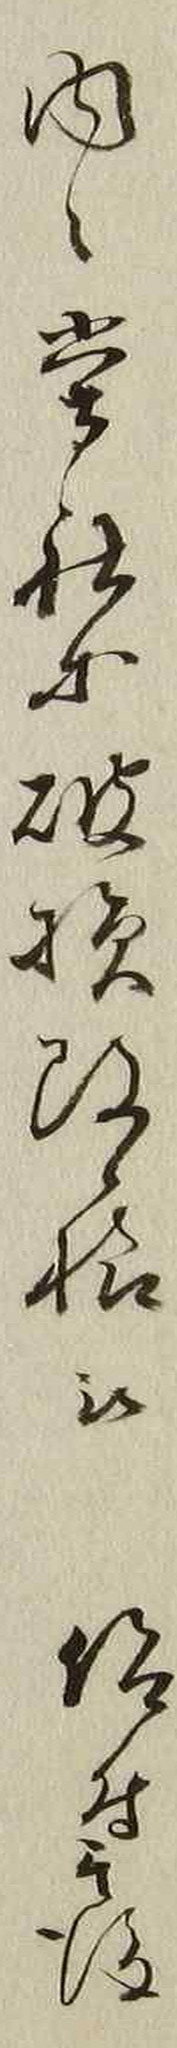内之堂社等破損改候様被仰付其後
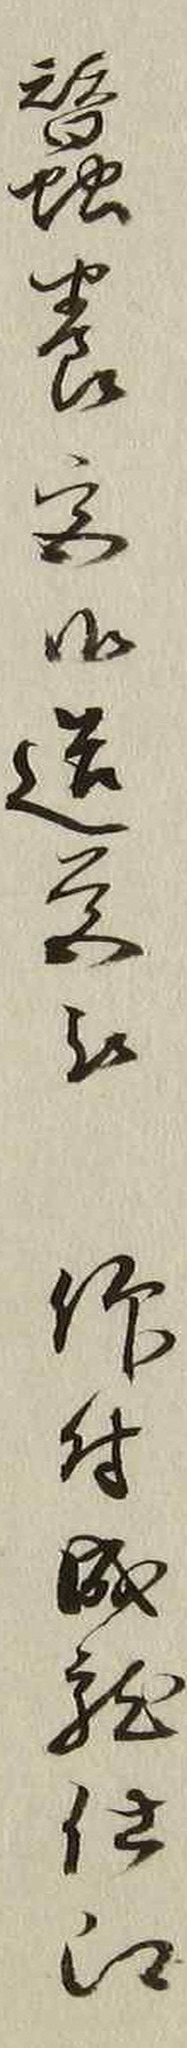蚕養宮御造宮被仰付成就仕江
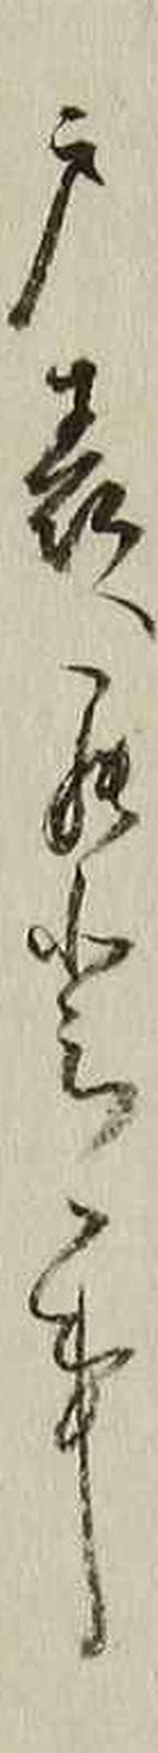戸表へ罷登候事
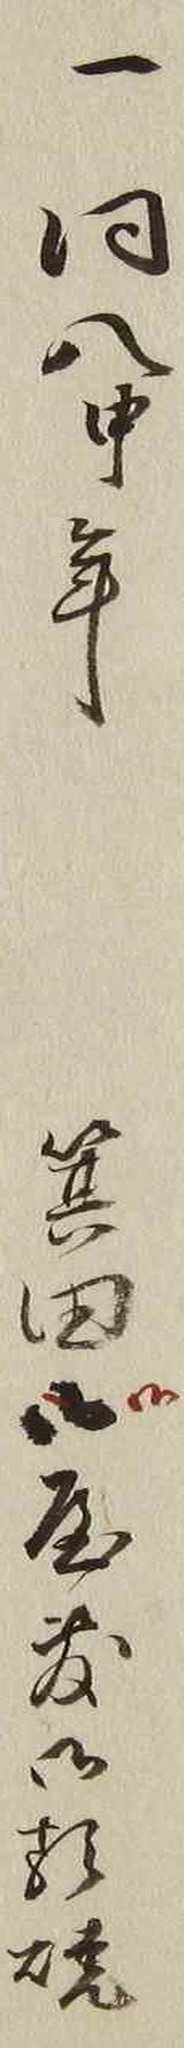一同八申年箕田御屋敷御類焼
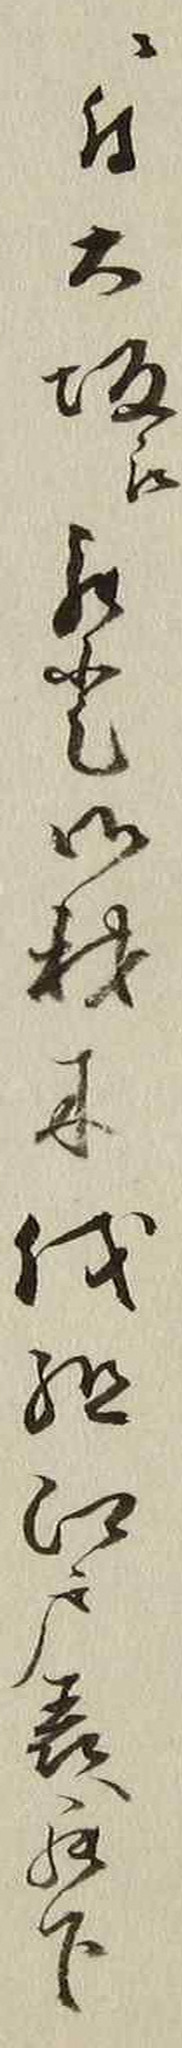ニ付大坂江罷登御材木伐組江戸表へ罷下
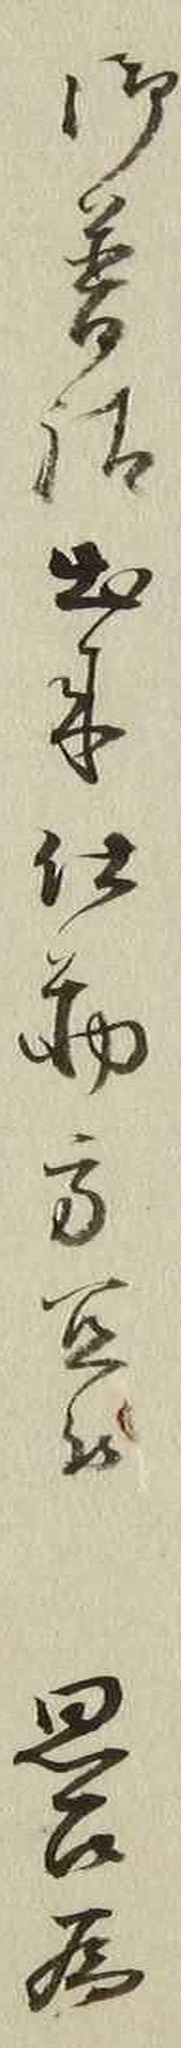御普請出来仕勤方宜被思召為
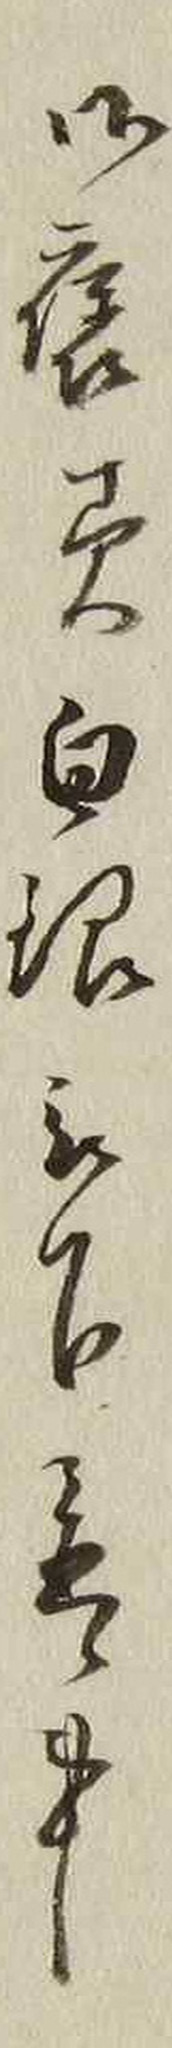御褒美白銀被下置候事
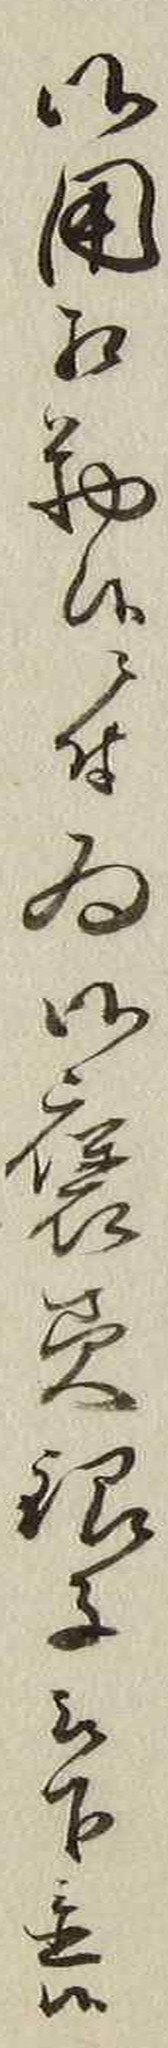御用相勤候ニ付為御褒美銀子被下置候
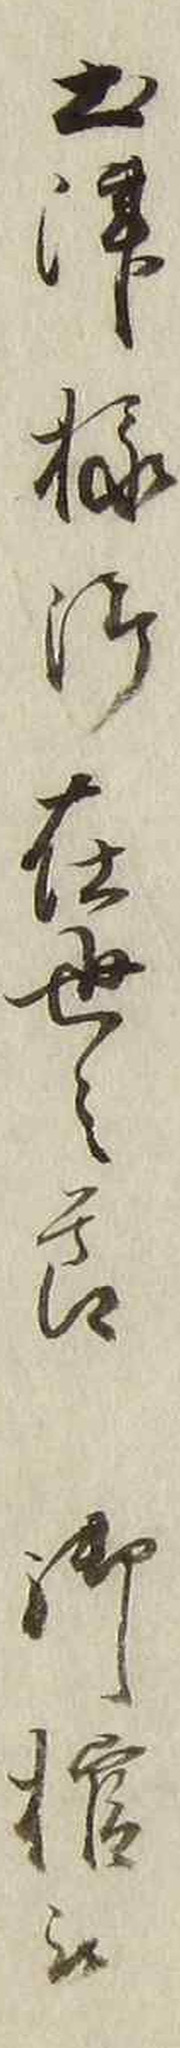土津様御在世之節御棺被
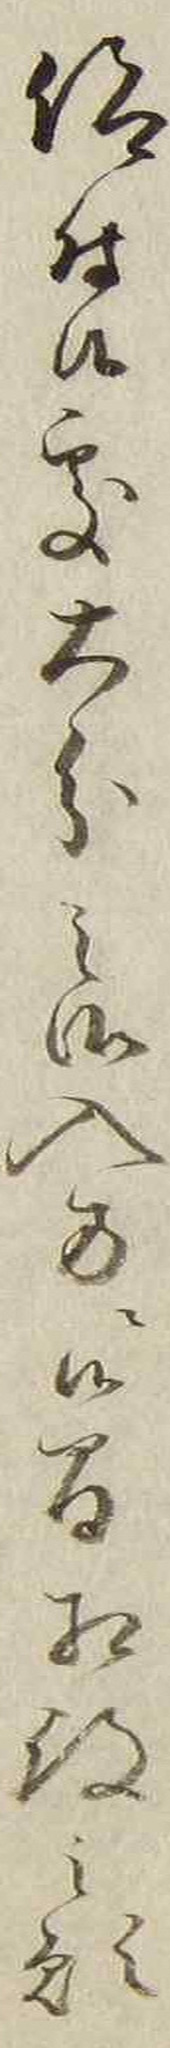仰付候処大分之御入方ニ候間相役之願

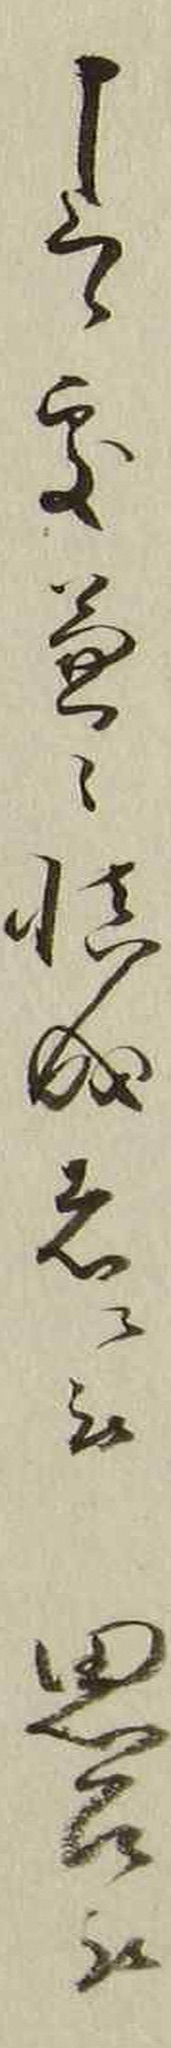申上候処兼々慎成者ニ被思召被
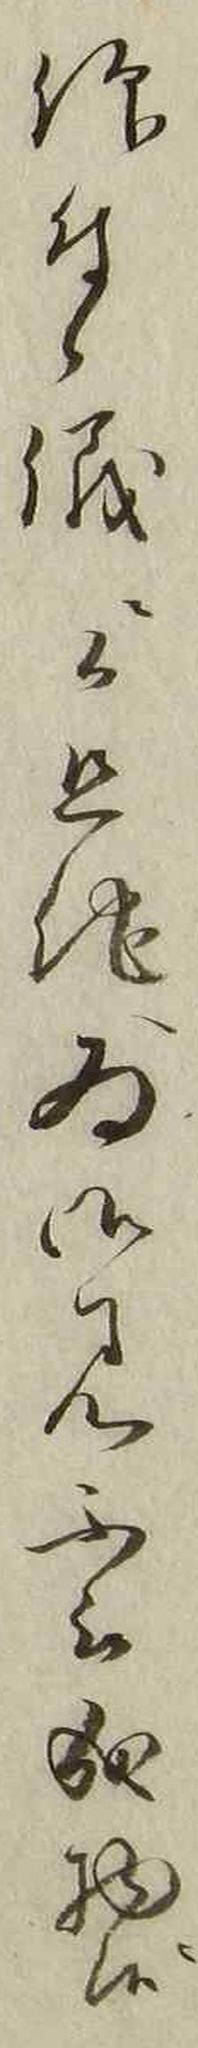仰付候儀ニ而且他へ為御見不被成物ニ候
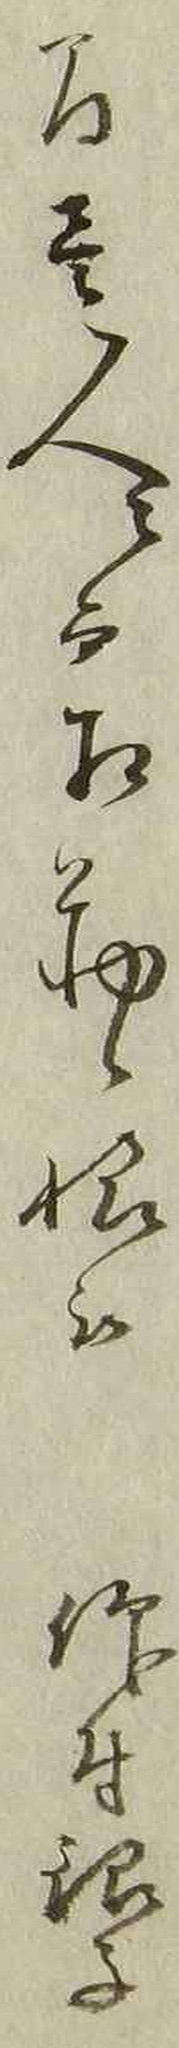間壱人ニ而相勤候様被仰付銀子
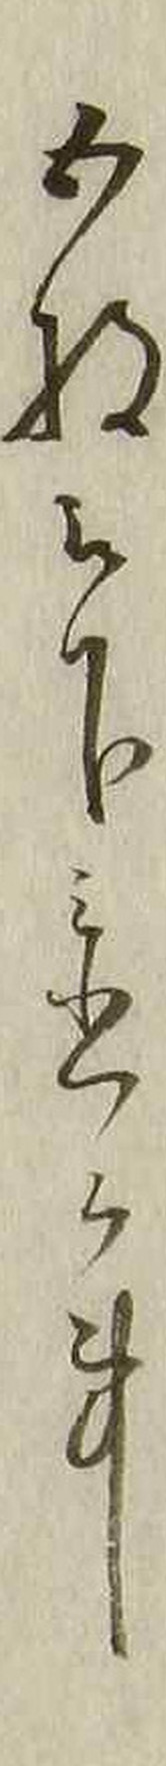五枚被下置候事
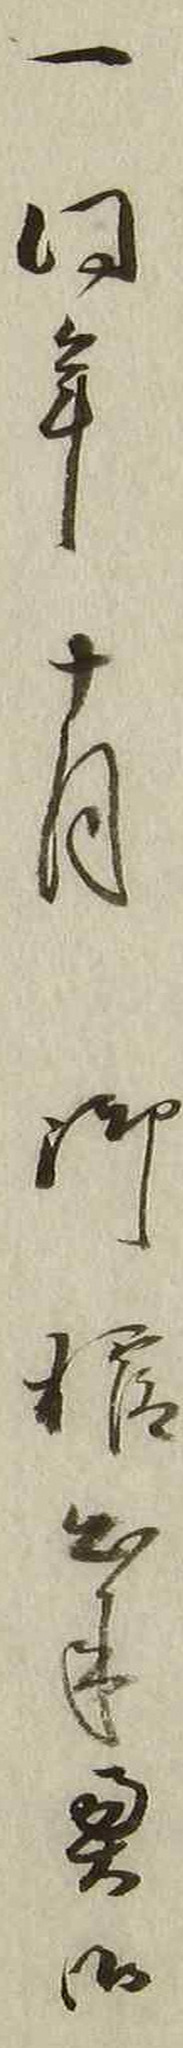一同年十月御棺出来奥御
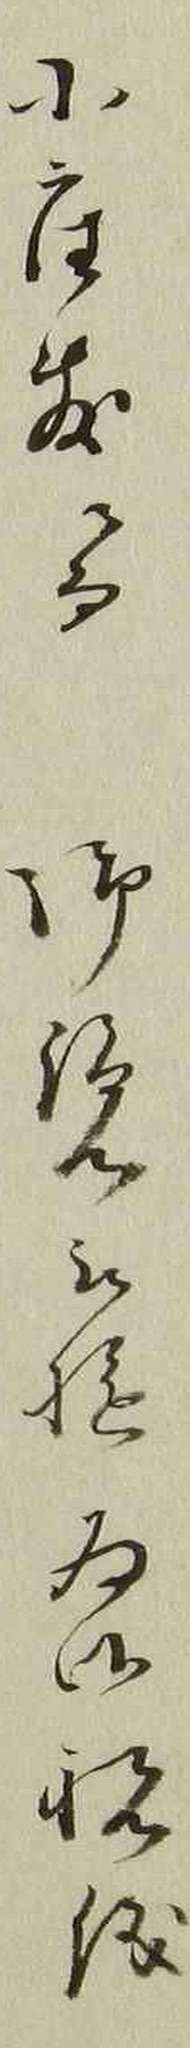小座敷ニ而御覧被遊為御祝儀
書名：諸士系譜　巻之28　い之部28
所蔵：会津若松市立会津図書館
